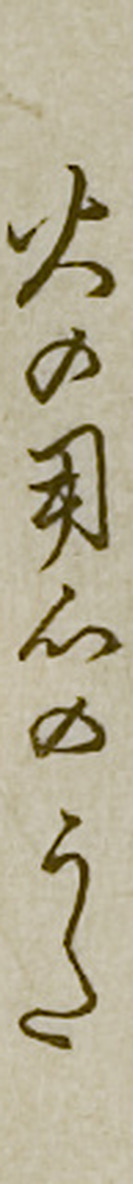火の用心のうた
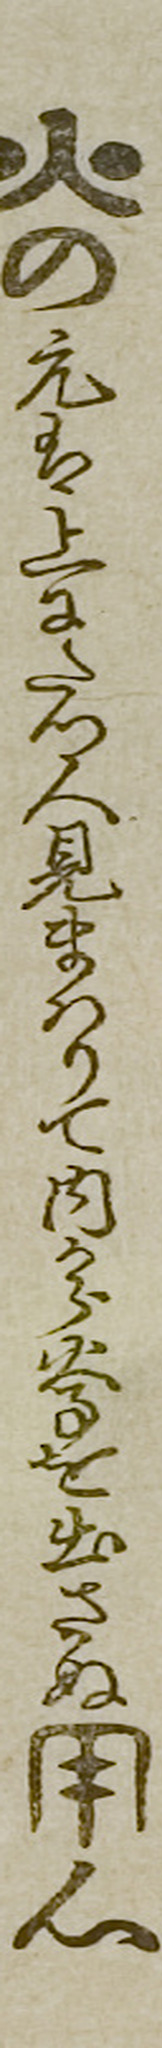火の元は上にたつ人見まはりて内から火事をださぬ用心
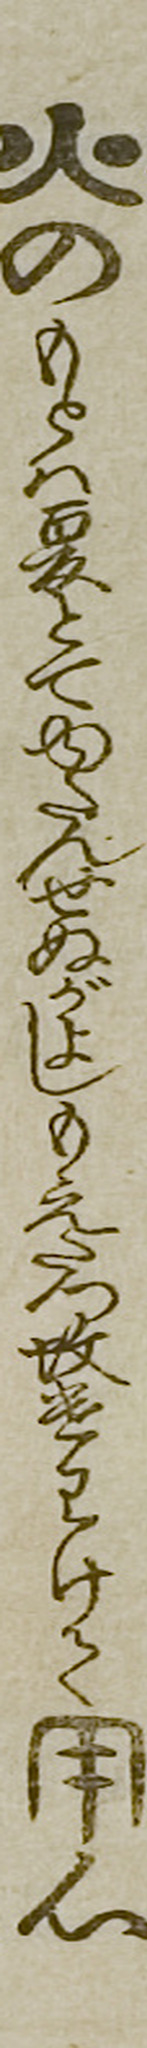火のもとは夏とてゆたんせぬがよしもえたつ蚊遣わけて用心
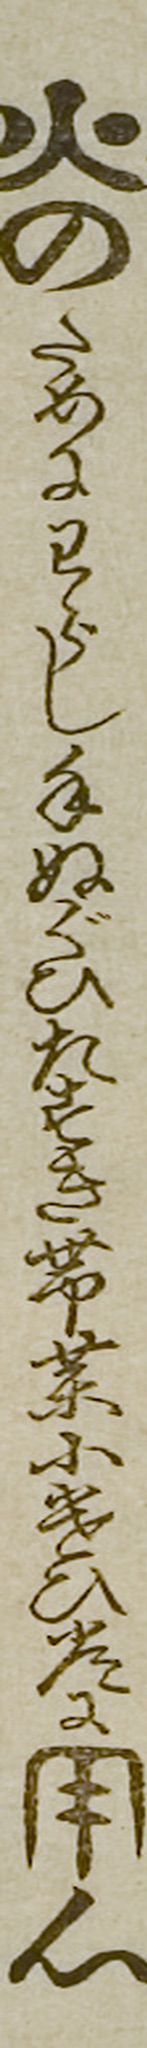火のためにわらし手ぬぐひたすき帯薬小遣ひ常に用心
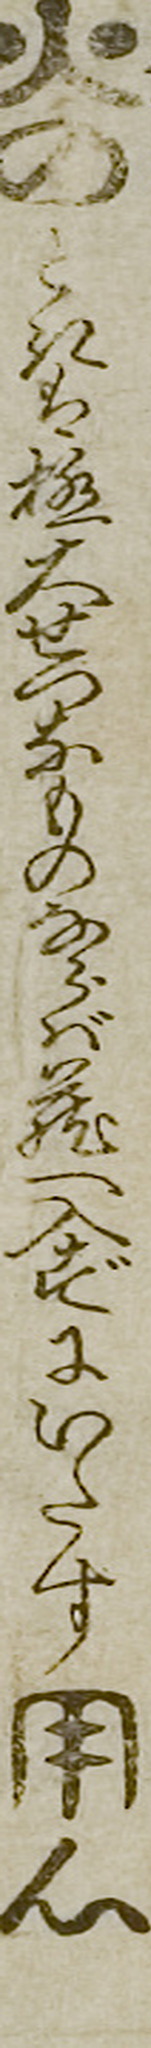火のときは極大せつなものならば蔵へ入ずにいたす用心
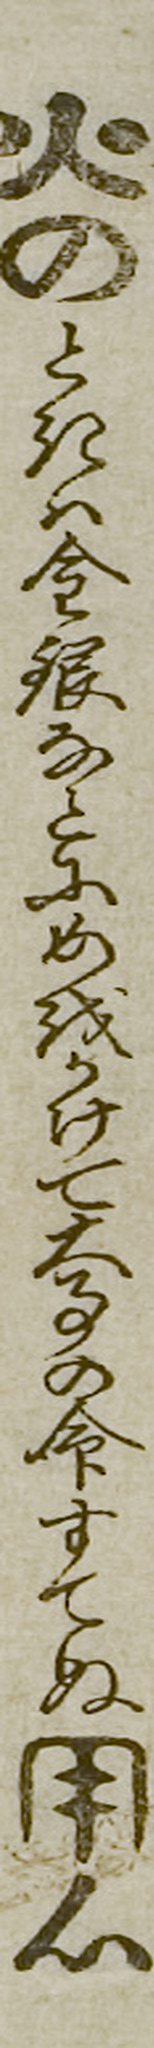火のときは金銀なとにめをかけて大事の命すてぬ用心
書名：火用心
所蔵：東京大学総合図書館 General Library in the University of Tokyo, JAPAN
